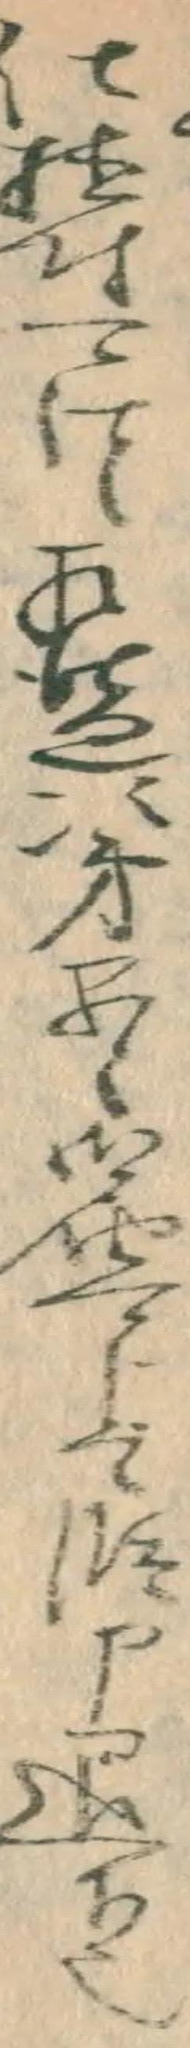仕植付可仕候相仕廻次第早々御届可申上候段申退下也
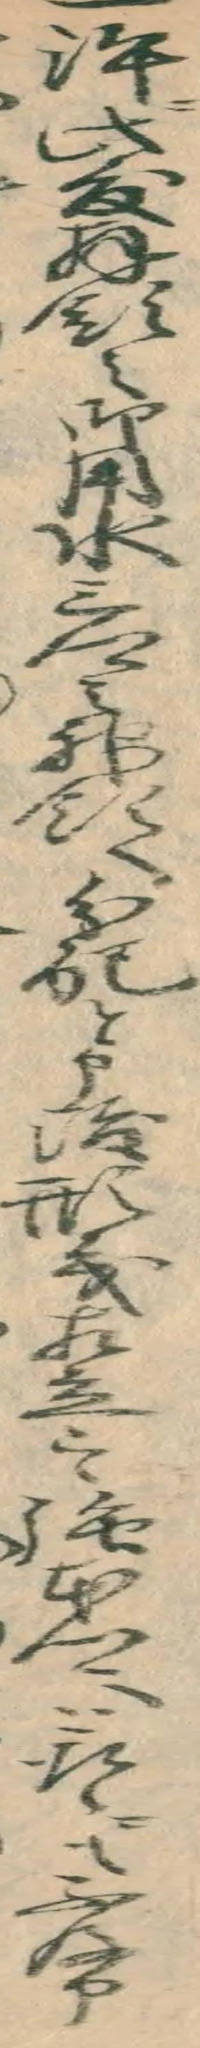一評ニ此度拝領之御用水三郷之神領へ分配と申渡形義相立候ハヽ強本郷へハ取候ニも不及申
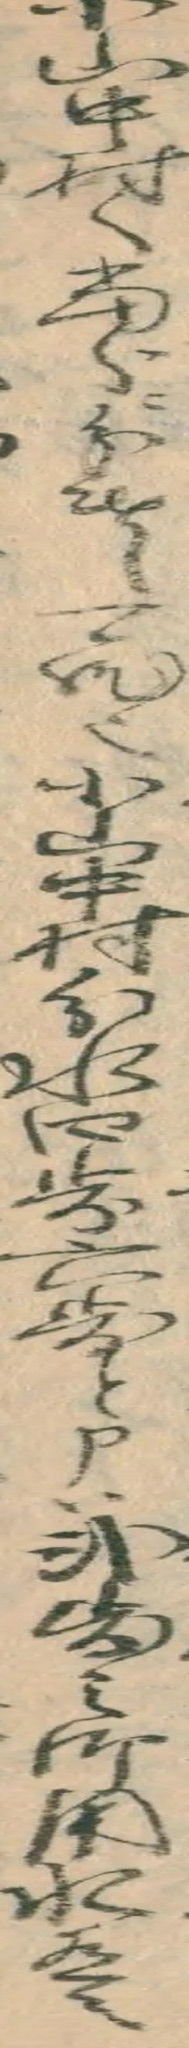小山中村へ当分ニ分遣し可然也小山中村分水四歩六歩と申ハ弐歩之御用水有之
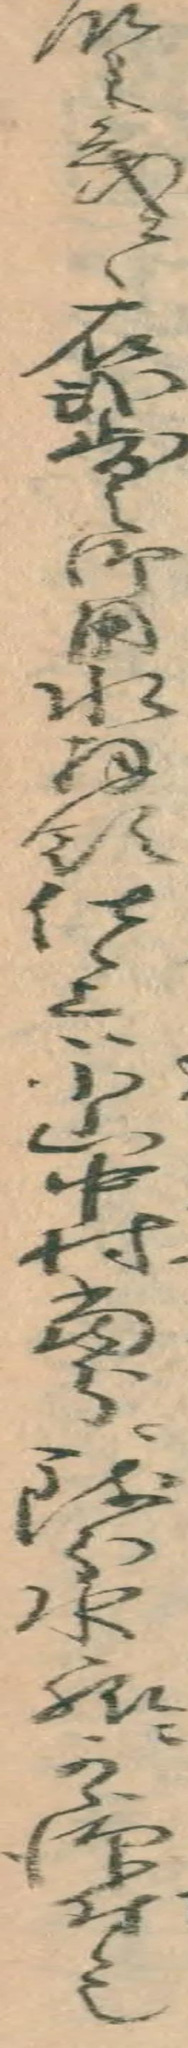故之義ニ候右弐歩之御用水拝領仕候上ハ小山中村當分ニ致分水候様ニ可被仰付候也

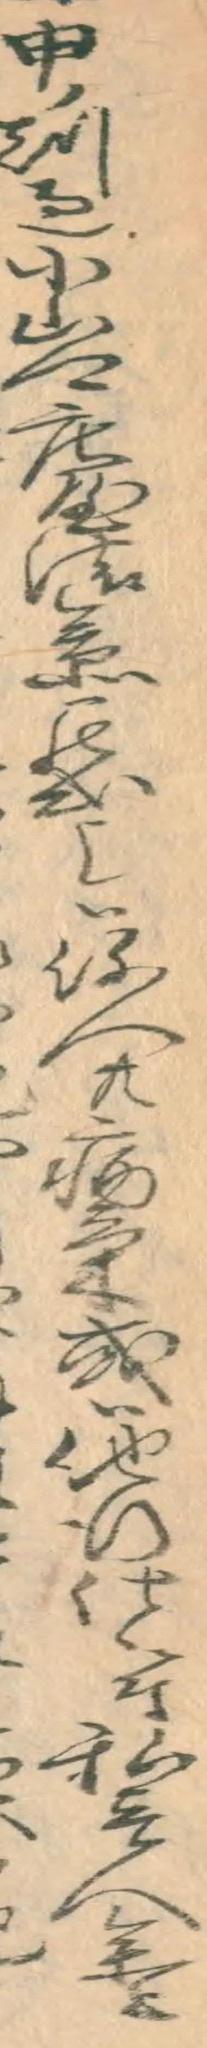一申ノ刻過小山郷庄屋清兵衛罷出申候ハ役人共病気或ハ他行仕候ニ付私壱人参上
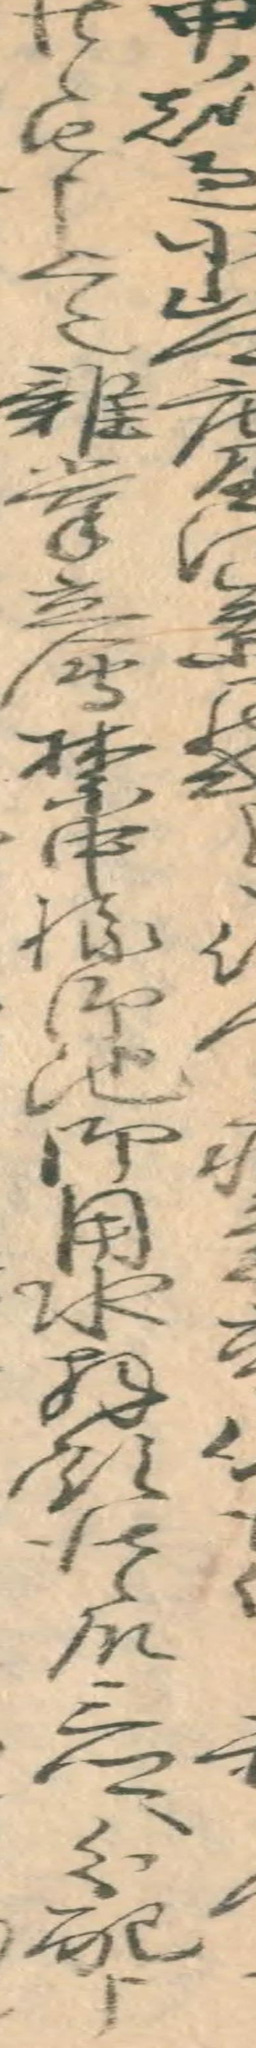仕候由申上也雑掌立会禁中様御池御用水拝領仕候故三郷へ分配申
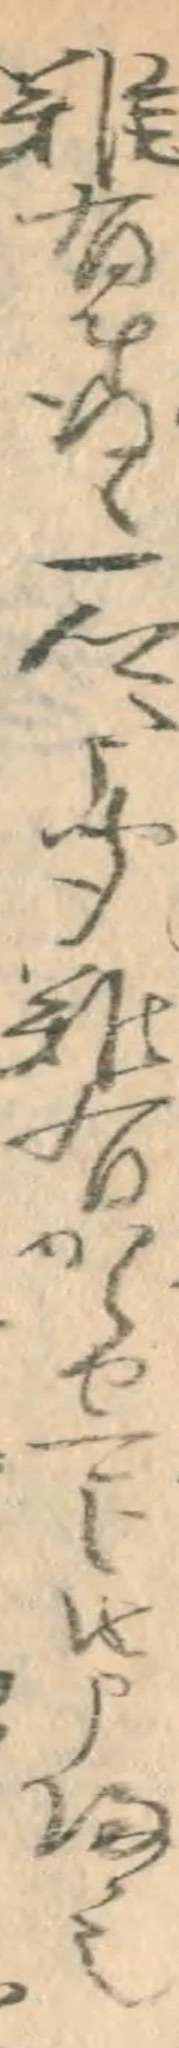難有奉存候一郷へ申聞難有からせ可申由申帰候也
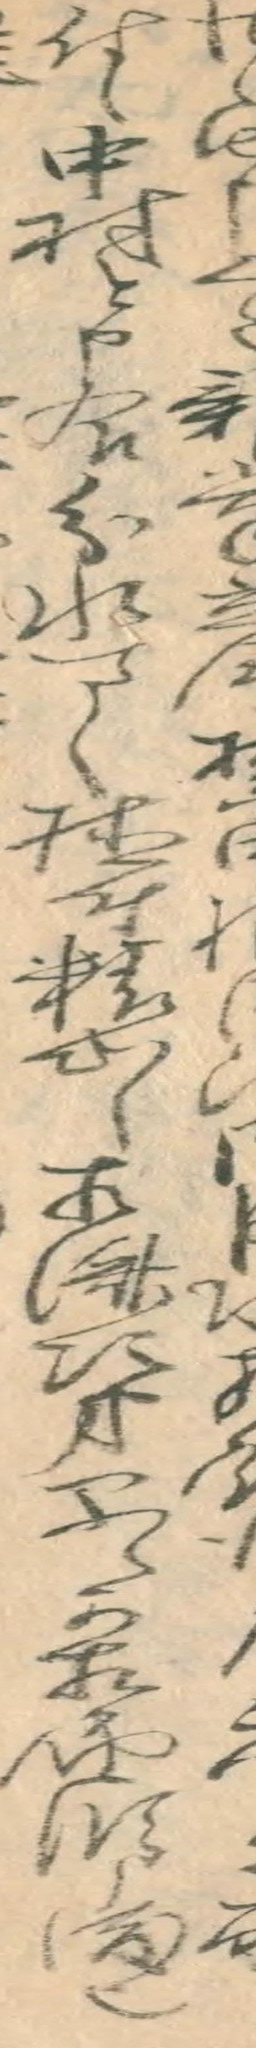付候中村と申合分水いたし植付精出し相済次第早々可相届段申渡也
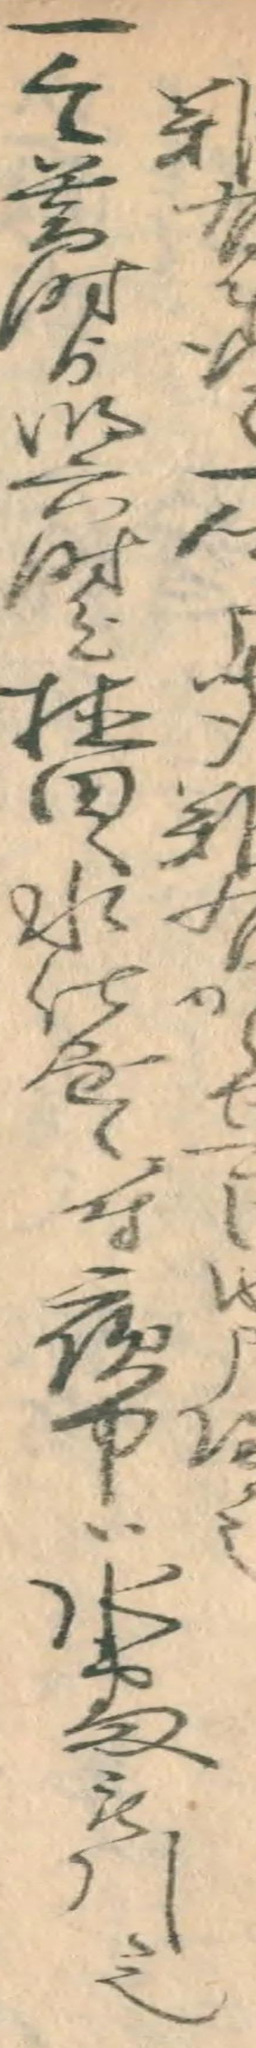一今暮時ゟ明六時迄植田へ水仕懸候ニ付夜中ハ水番取引候也
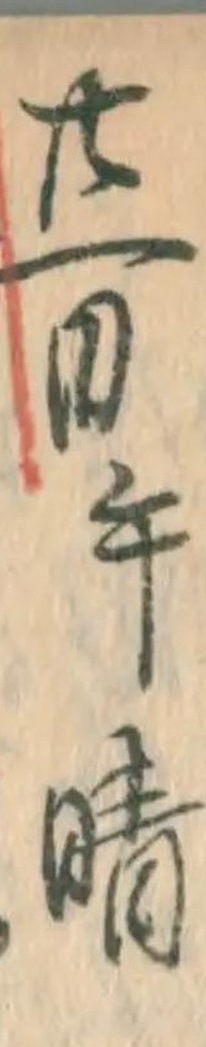廿一日午晴
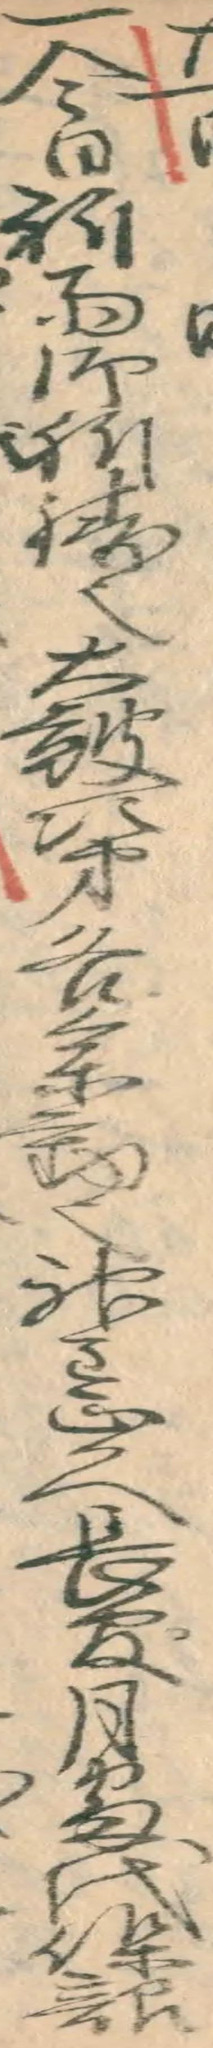一今日祈雨御祈祷也大鼓次第各参勤也神主正久長官月番代保韶
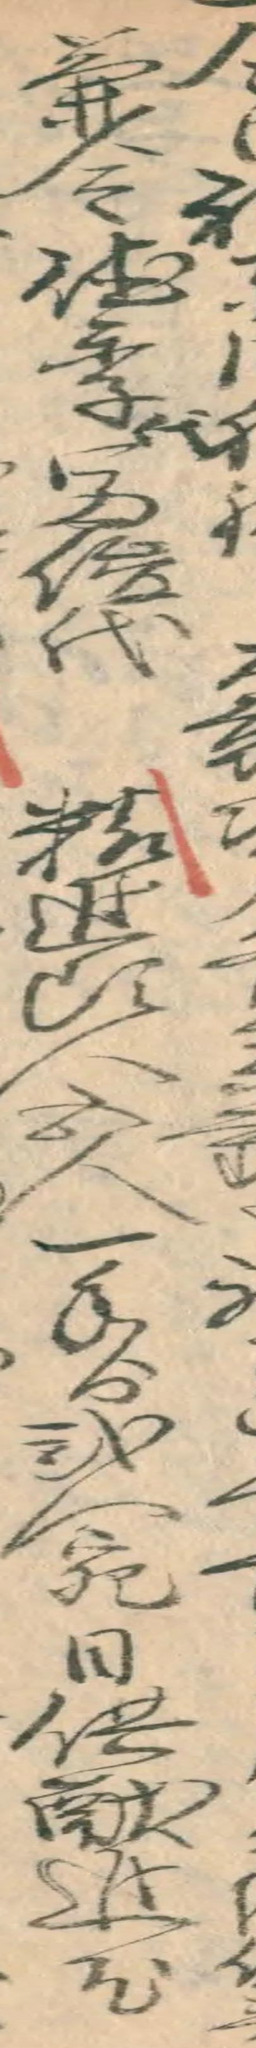兼令徳季代富俊代精進頭人五人一手ゟ弐人宛日供献進尤
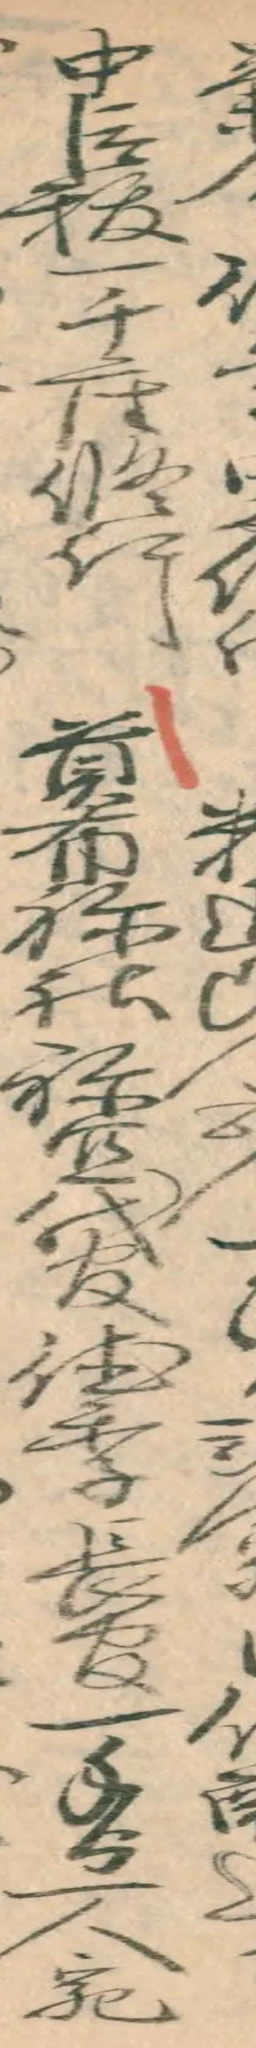中臣祓一千座修行貴布祢社祢宜代官徳季長官一手ゟ一人宛
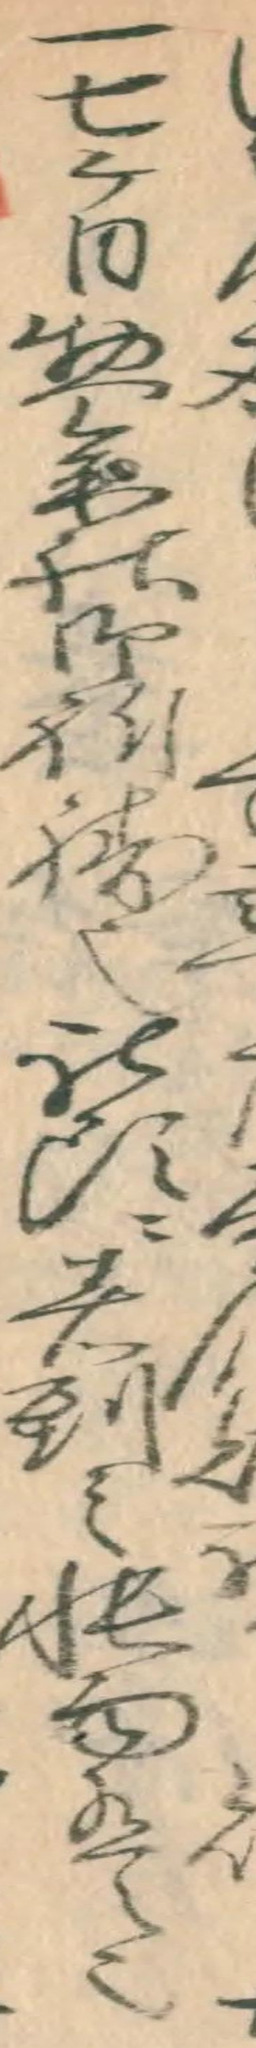一七ケ日惣参社御祈祷也社頭ニ着到之帳面有之也
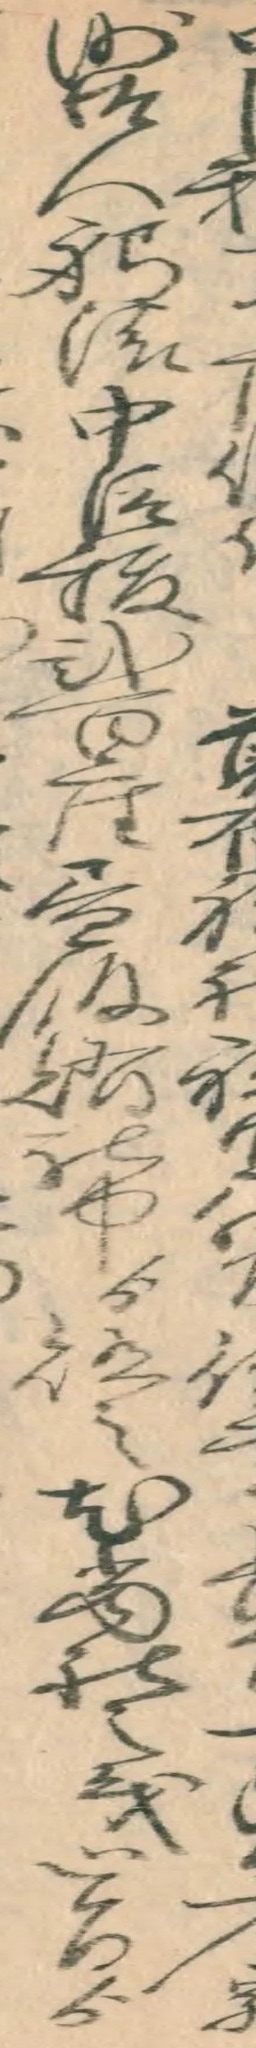沙汰人躬清中臣祓弐百座昼飯賄社中ゟ賄之尤当社之義ハ今日ゟ
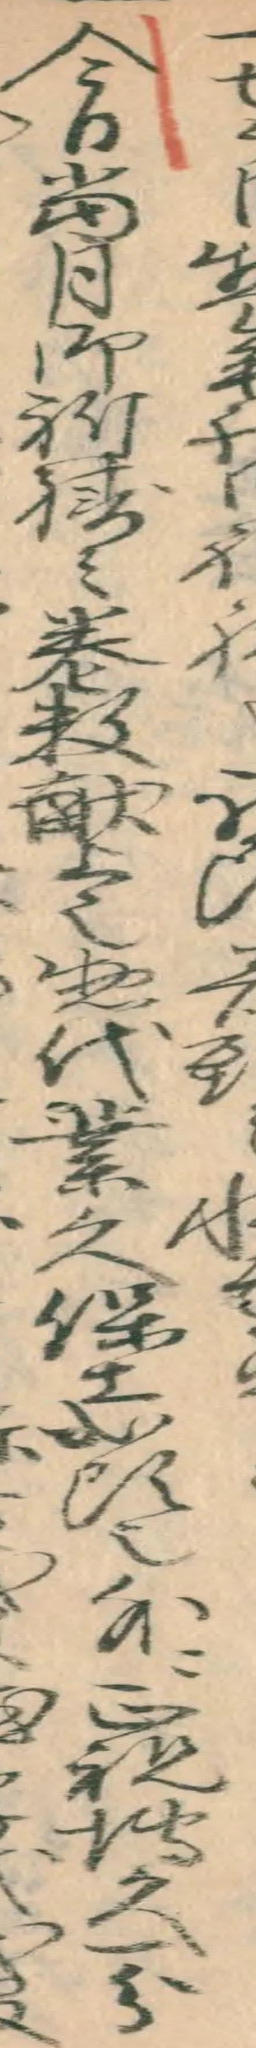一今日当月御祈祷之巻数献上也惣代業久保土出頭也外ニ正祝博久一分
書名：賀茂社記録. 第58冊
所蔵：国立国会図書館 National Diet Library, JAPAN
